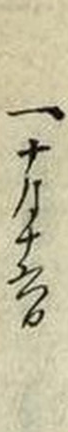一十月十五日
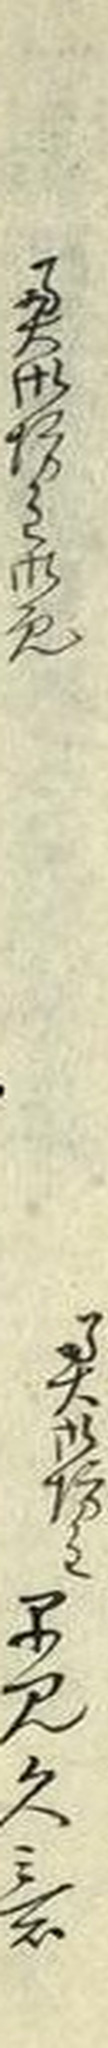奥御坊主御免奥御坊主早見久意
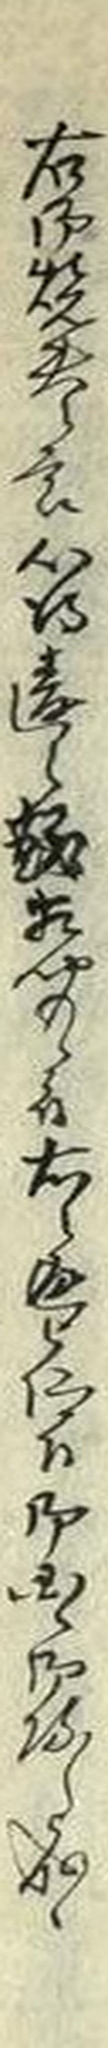右御焼失之節心得違之趣相聞候ニ付右之通被仰付御国へ御帰し被成候
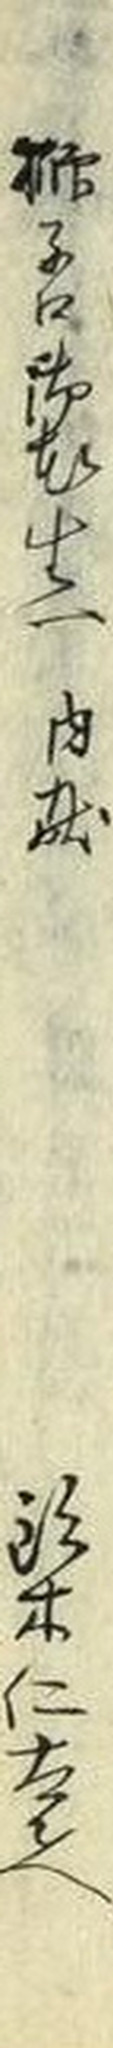獅子口御花生一内献鈴木仁太夫
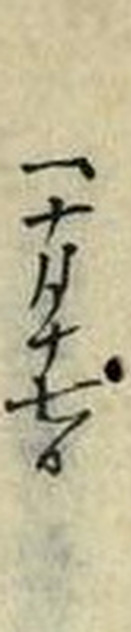一十月七日

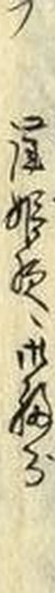謹姫様へ御福分
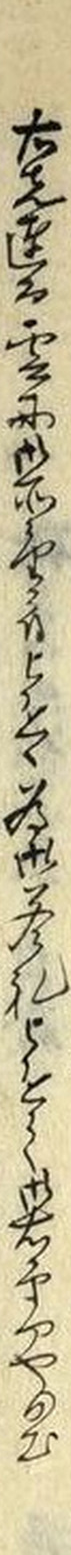右先達而雲丹御所望ニ付被進之為御答礼被進之御右筆部屋ゟ出
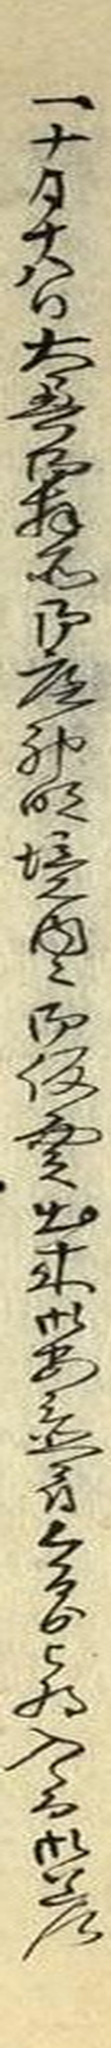一十月十八日大奥御拝所御庭神明境内ニ御仮殿出来御安置ニ付今日ゟ被為入候而御差
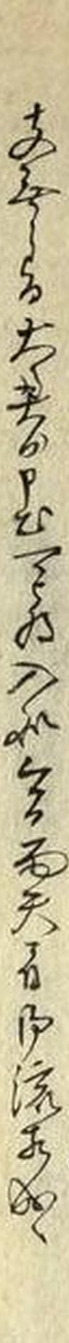支無之旨大奥ゟ申出可被為入処今日雨天ニ付御流相成候
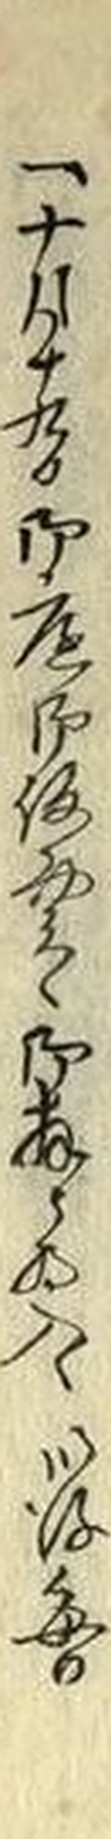一十月十九日御庭御仮殿へ御拝被為入候以後毎日
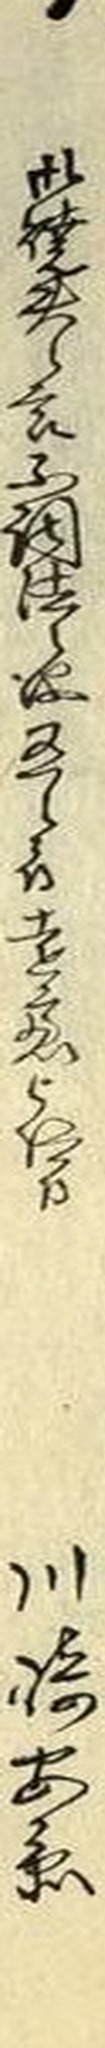御焼失之節不調法之儀有之ニ付遠慮被仰付川崎安兵衛
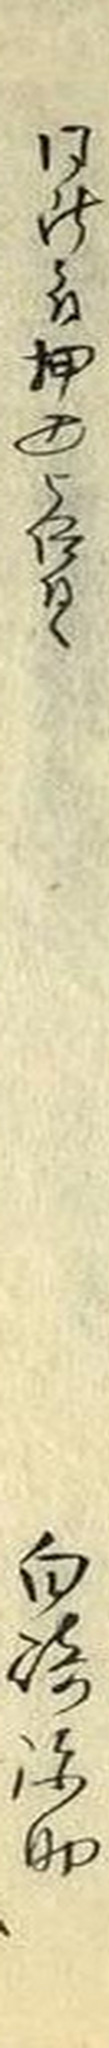同断ニ付押込被仰付候白崎弥助
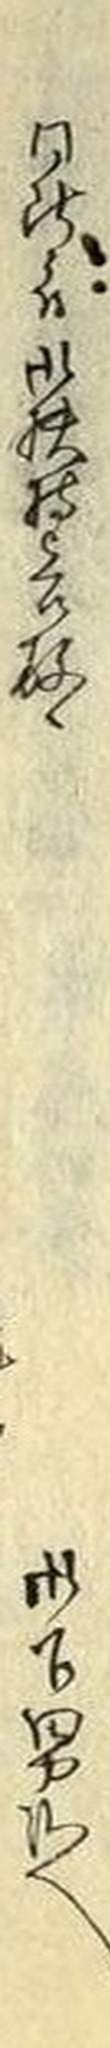同断ニ付御扶持被召放候御下男弐人
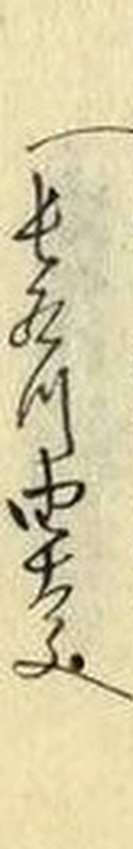長谷川由太夫
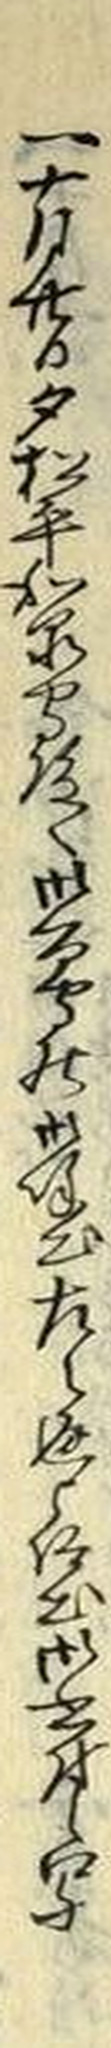一十月廿日夕松平和泉守殿へ御留守居御呼出左之通被仰出御書付之写
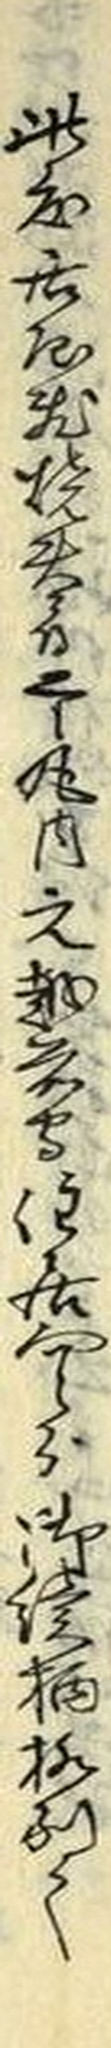此度居屋敷焼失ニ付二ノ丸内元越前守住居向之分御続柄格別之
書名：少傅日録抄（斉善付側向頭取日記、在府）
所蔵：福井県文書館 Fukui Prefectural Archives
